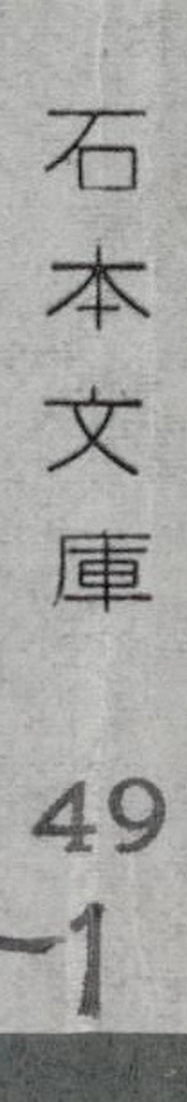石本文庫-
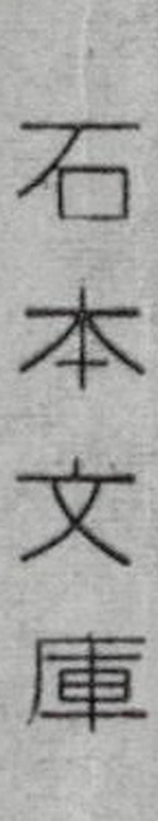石本文庫-
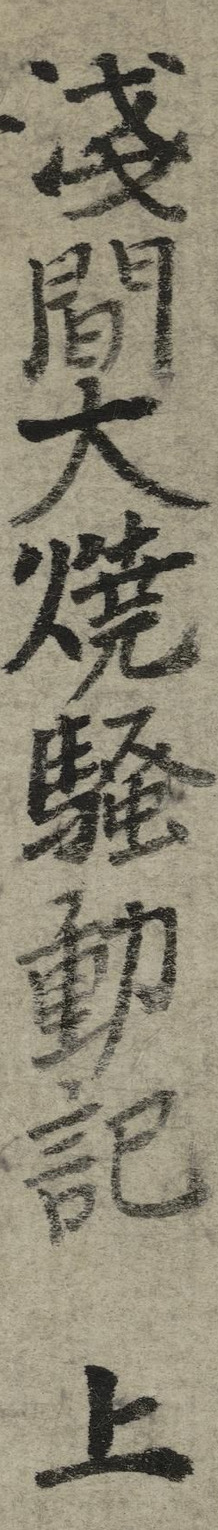浅間大焼騒動記上

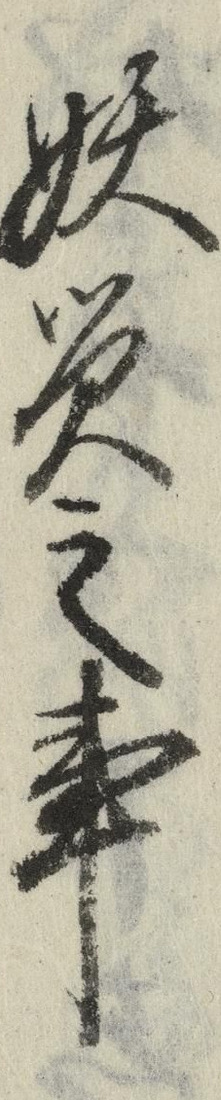妖災之事
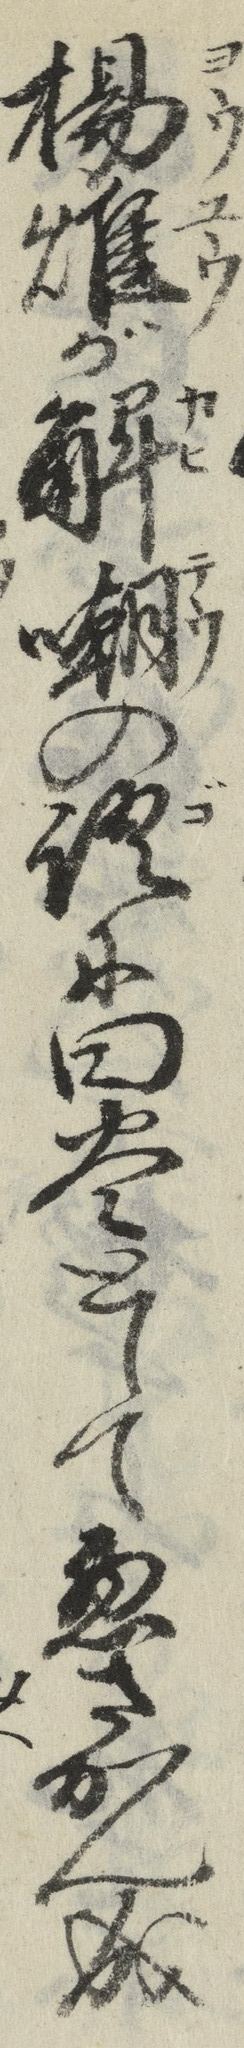楊雄が解嘲の語に曰炎として悪さかん成
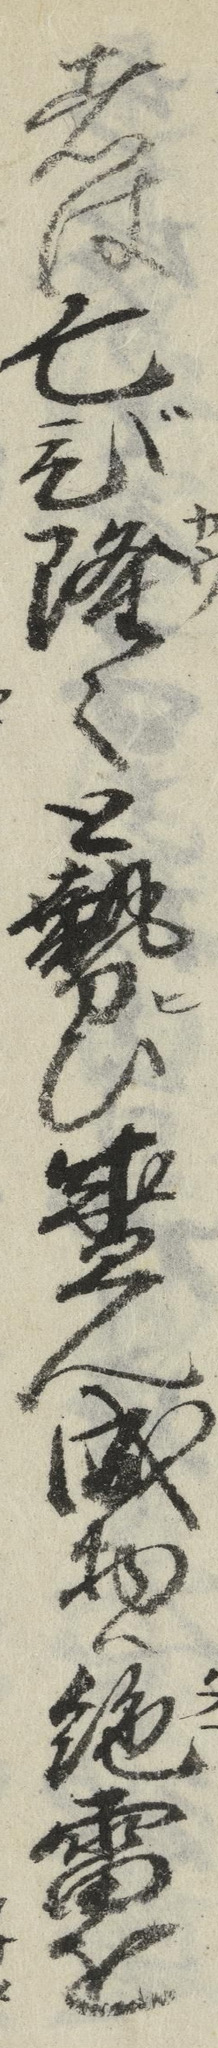者は亡び隆々と勢ヒ盛ん成物は絶雷を
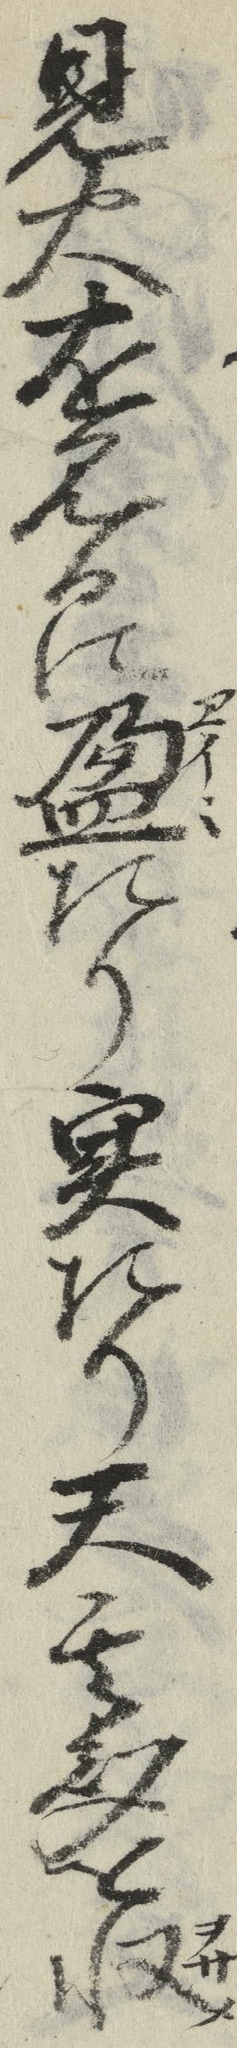見火を見るは盈たり実たり天其声を収
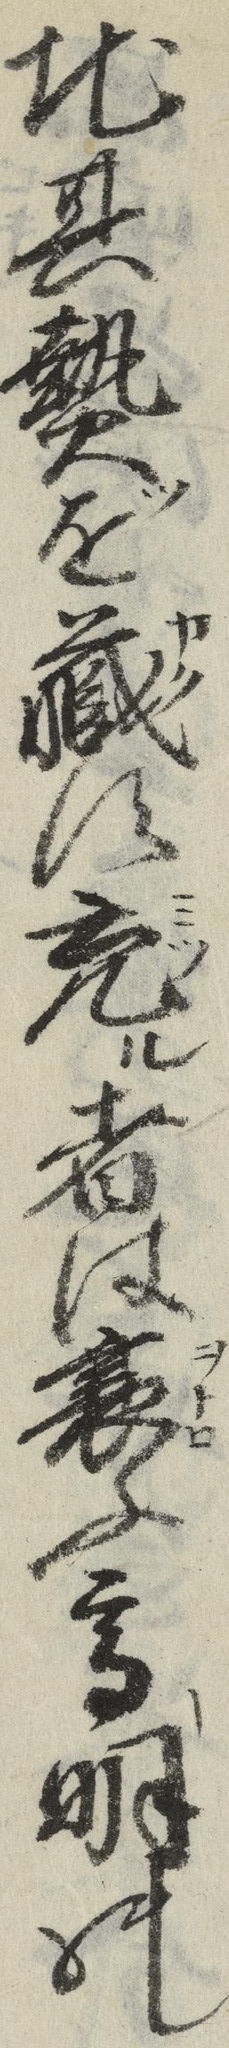地其熱ツを藏す充ル者は衰ふ高明の
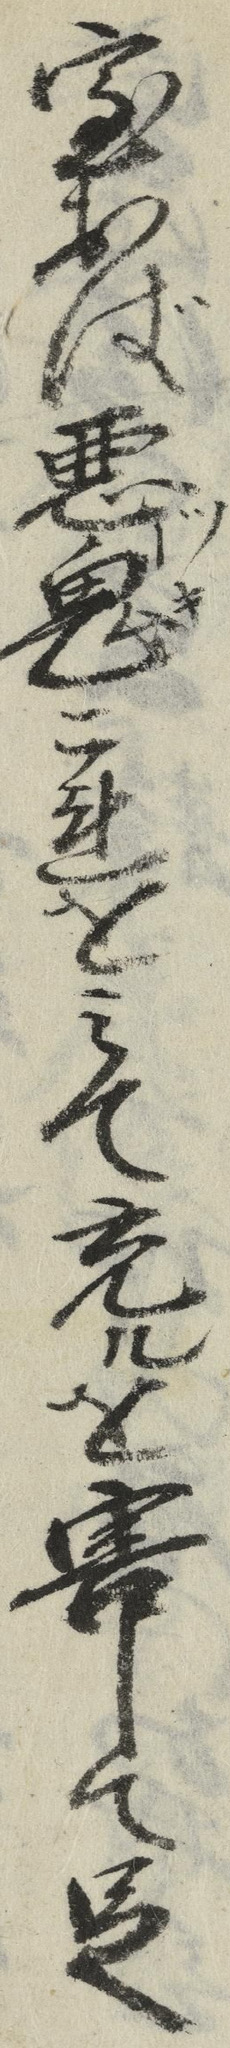宝おば悪ツ鬼これをみて充ルを害して足
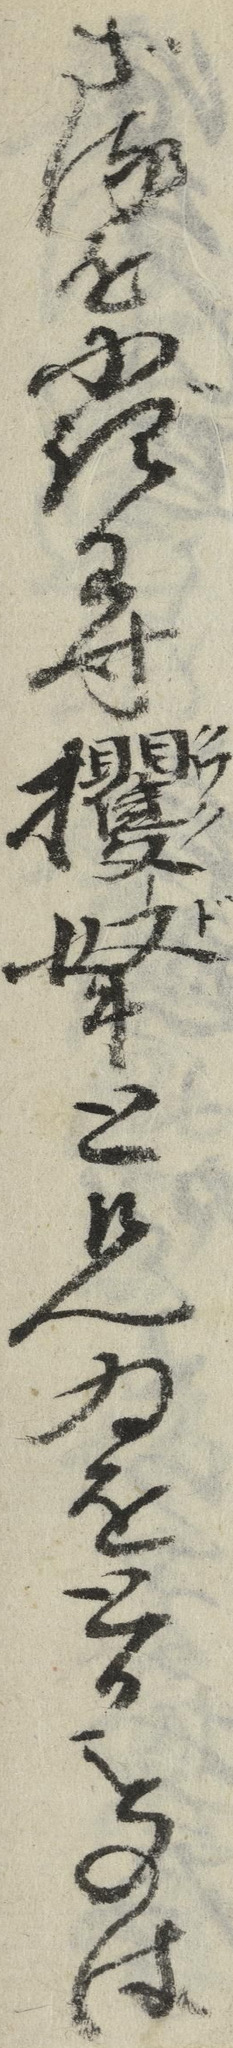ざるをにぎらす攫拏と見為をとるものは

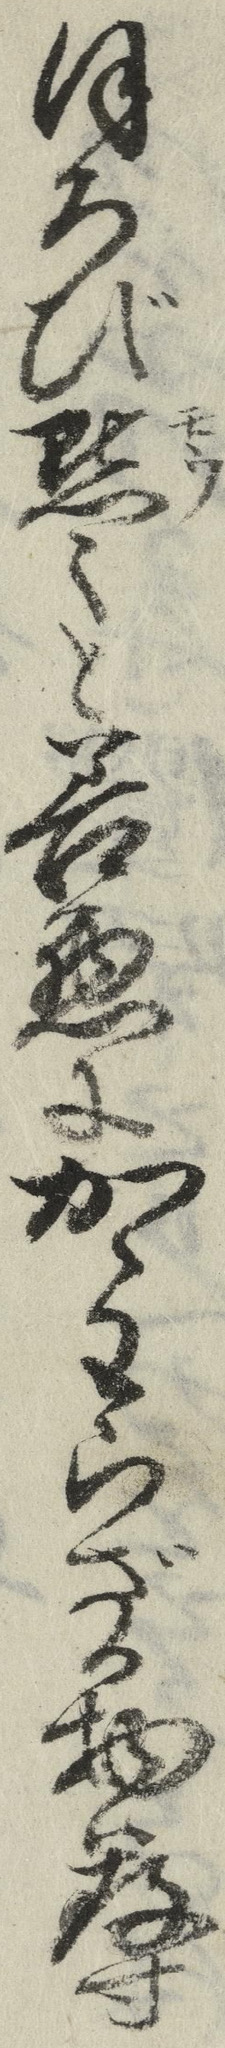ほろび恐々と善悪にかゝわらざる物は存す
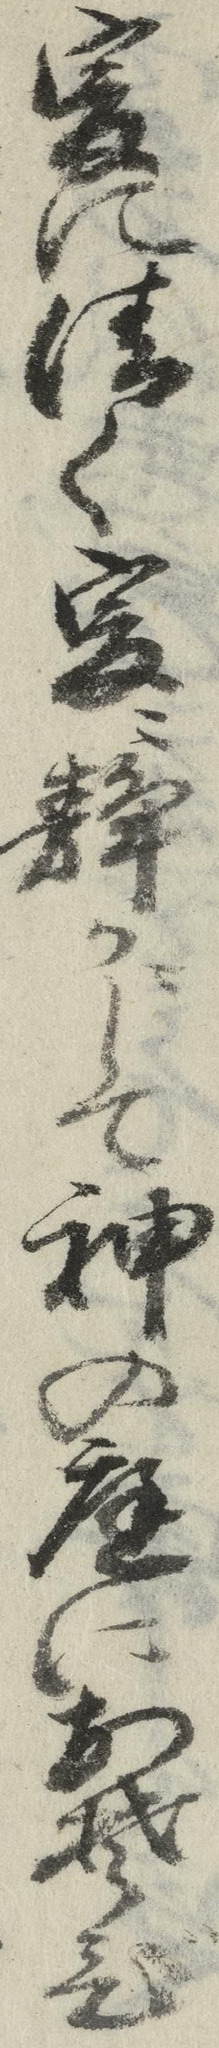爰に清く爰ニ静かニして神の庭にあそび
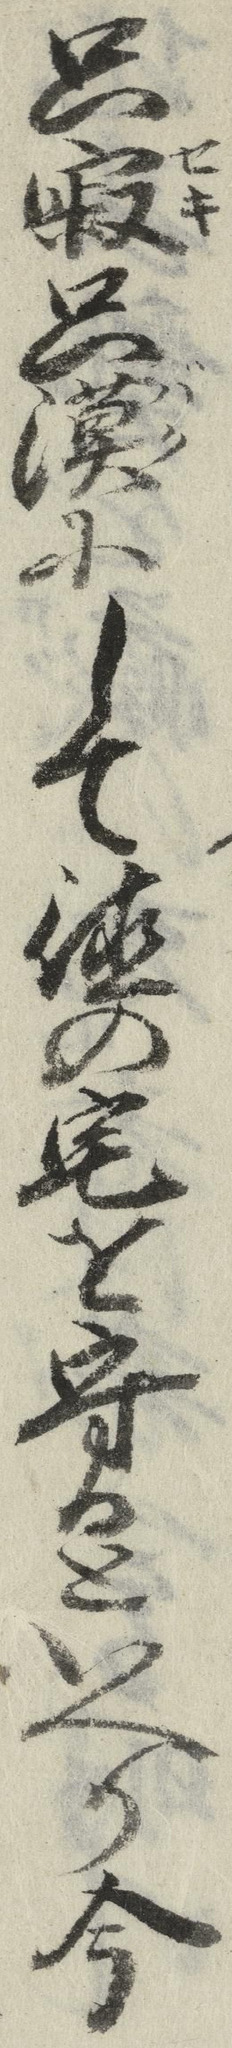只寂只漠にして徳の宅を守るといへり今
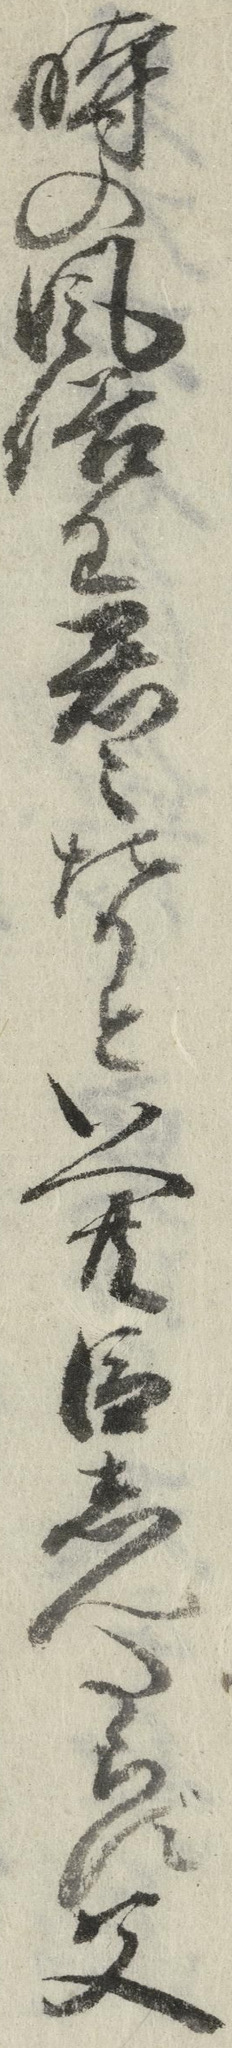時の風俗わ若々たりといへ共臣しんたらず父
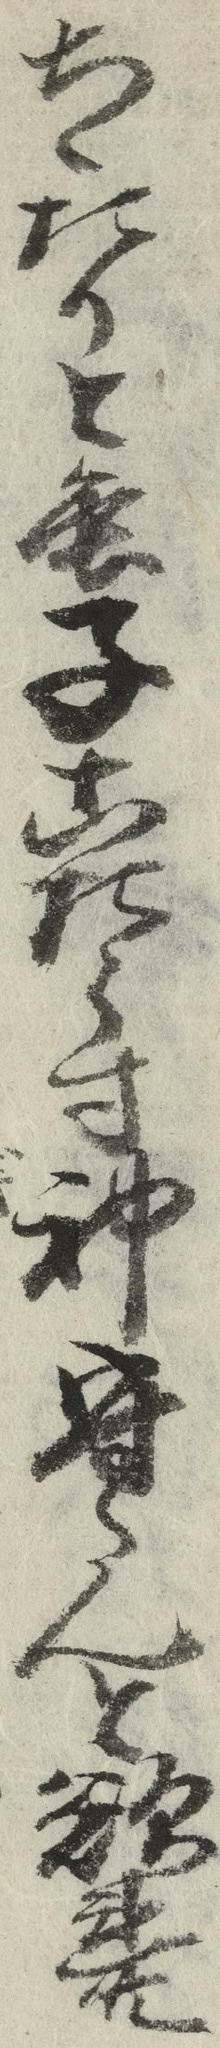ちゝたりと雖子こたらす神守らんと欲れ共
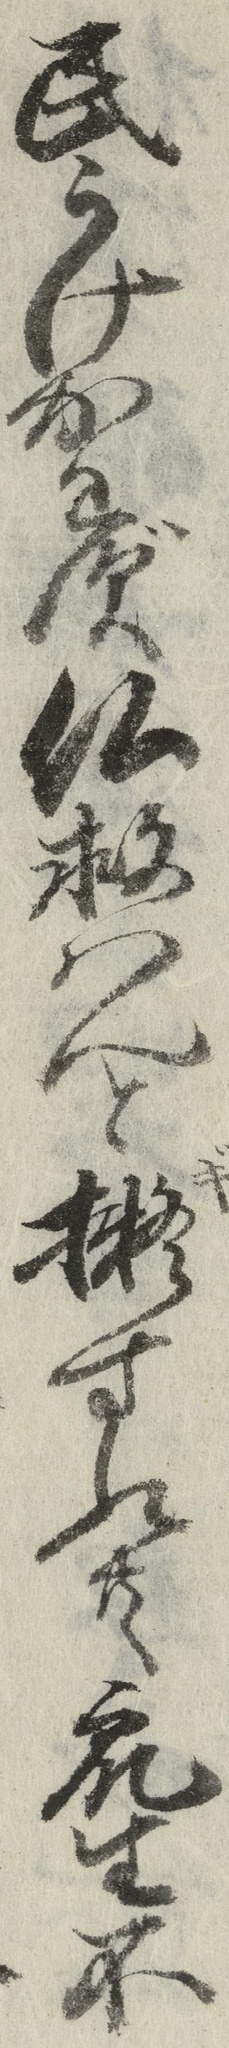民うけかわず仏救はんと擬すれ共衆生不
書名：浅間大焼騒動記　上
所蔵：東京大学地震研究所図書室 Earthquake Research Institute Library, The University of Tokyo, JAPAN
